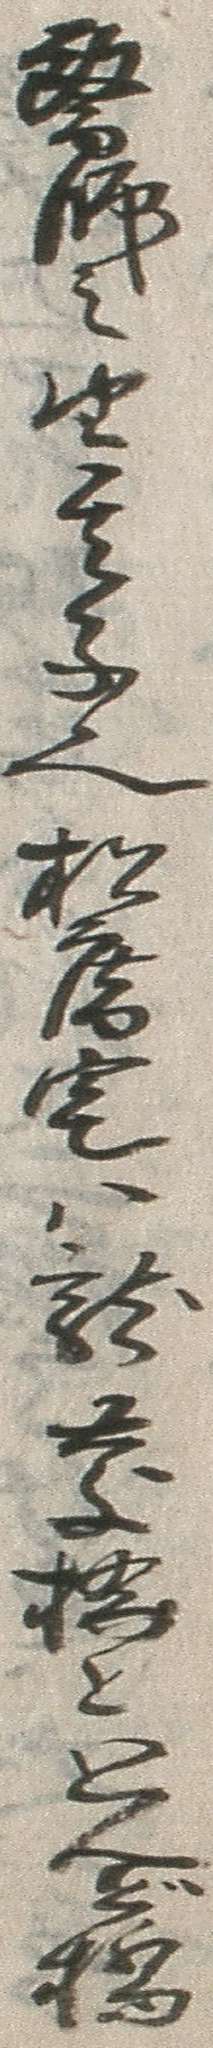医師之由其子也松庵宅は龍慶橋ととんど橋
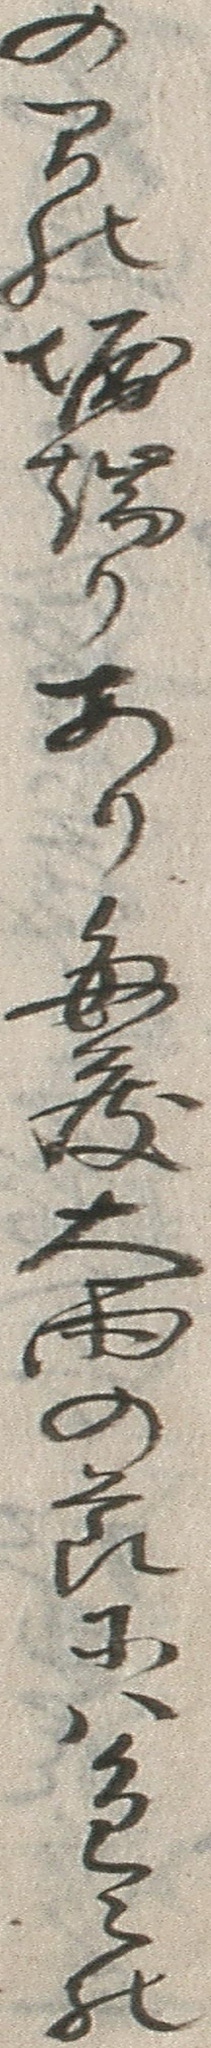の間の堀端にあり毎度大雨の節には色々の
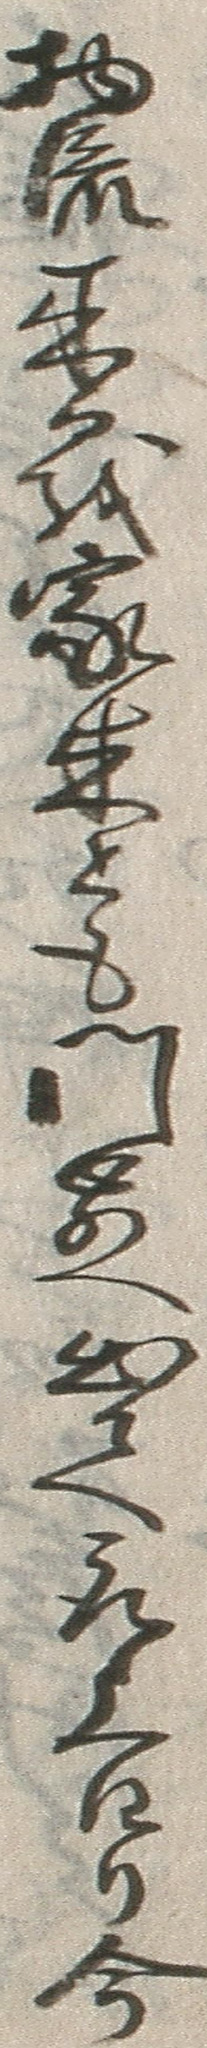物流来るを家来とも門前へ出て取上けり今
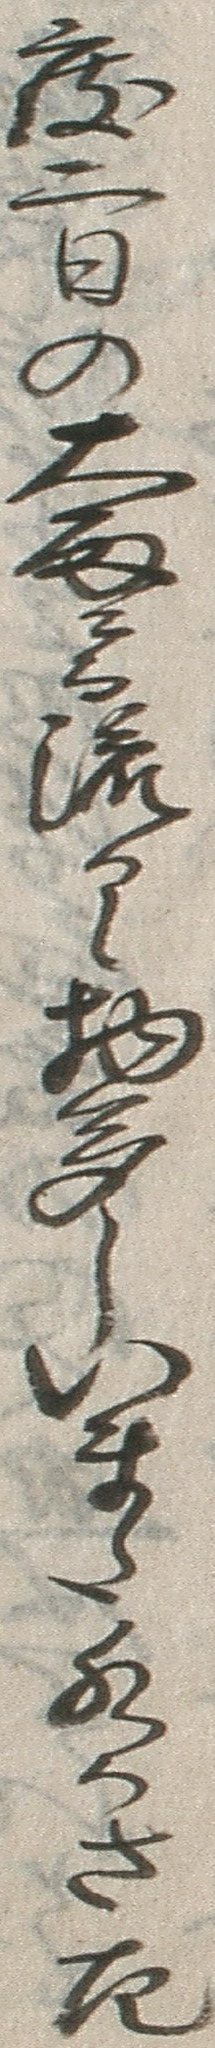度二日の大雨にて流るゝ物多しいまた水かさ左
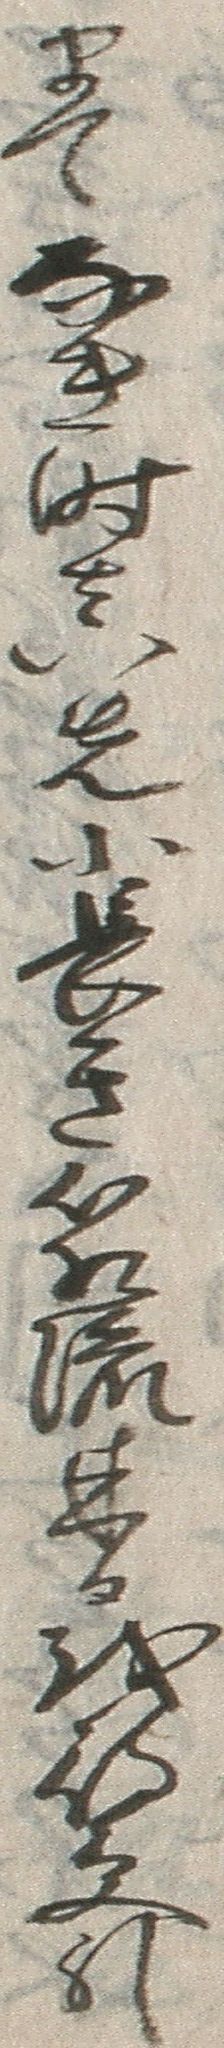まてなき時真先に長き箱流来るを待受引
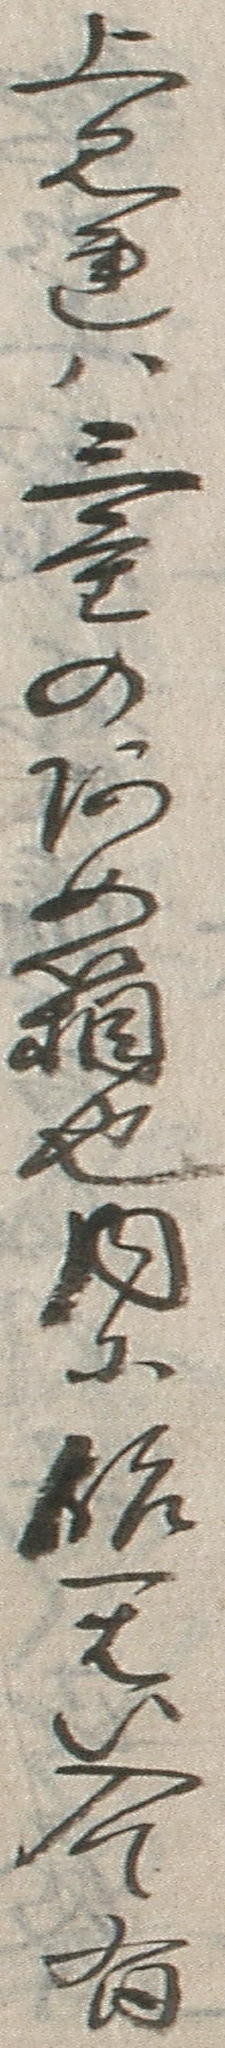上みれは三重のあめ箱也内に飴一はい入て有

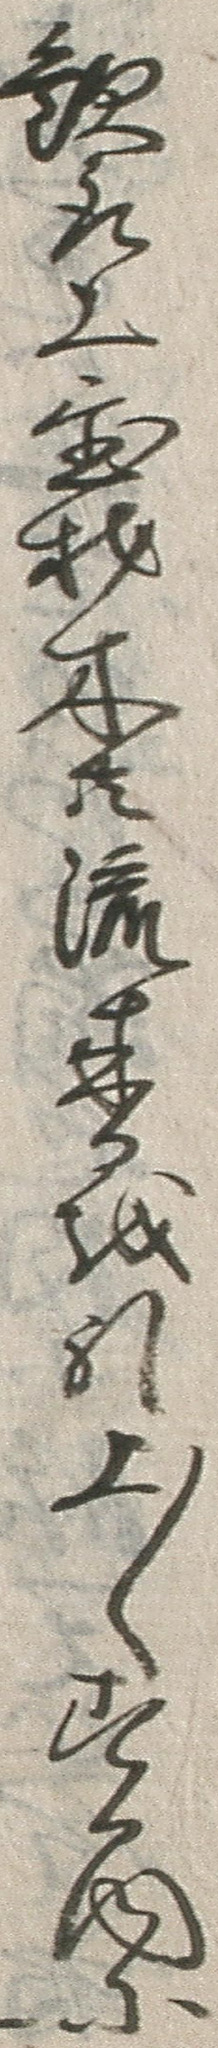歓取上置材木共流来るを引上〳〵する内に
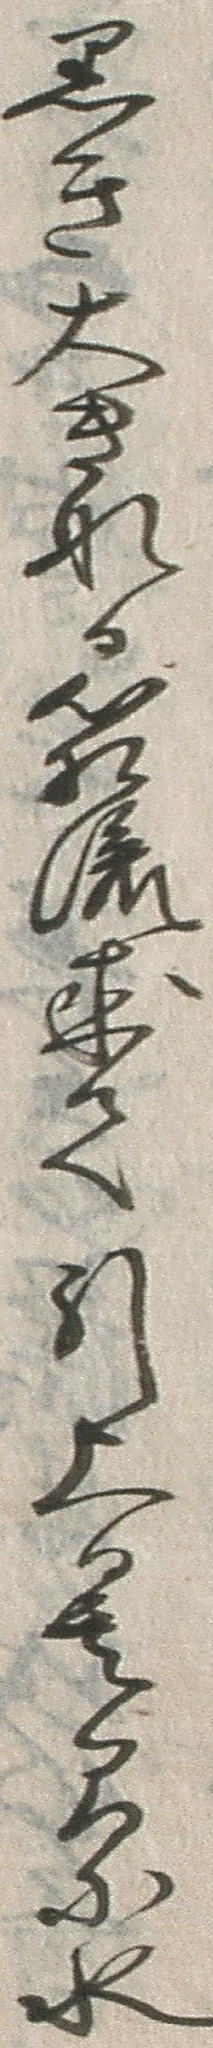黒き大きなる箱流来て引上る其間に水
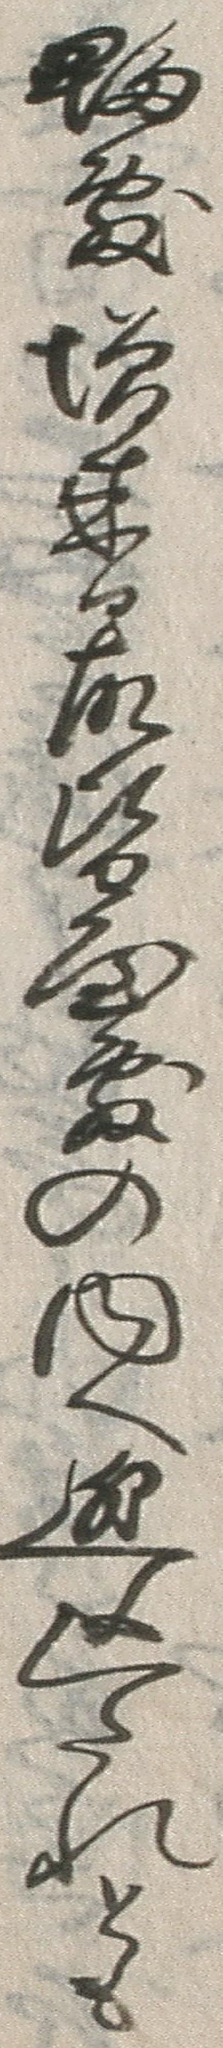夥敷増来る故皆屋敷の内へ逃込たれとも
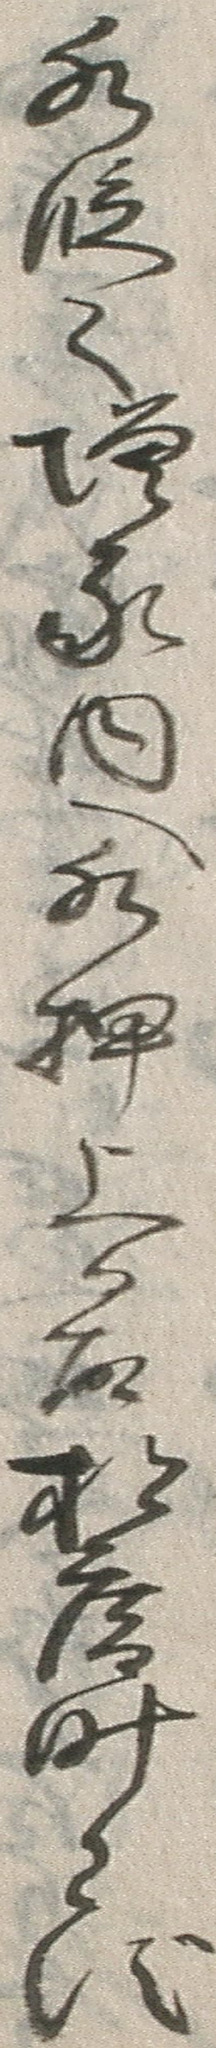水段々増家内へ水押上る故松庵叶わず
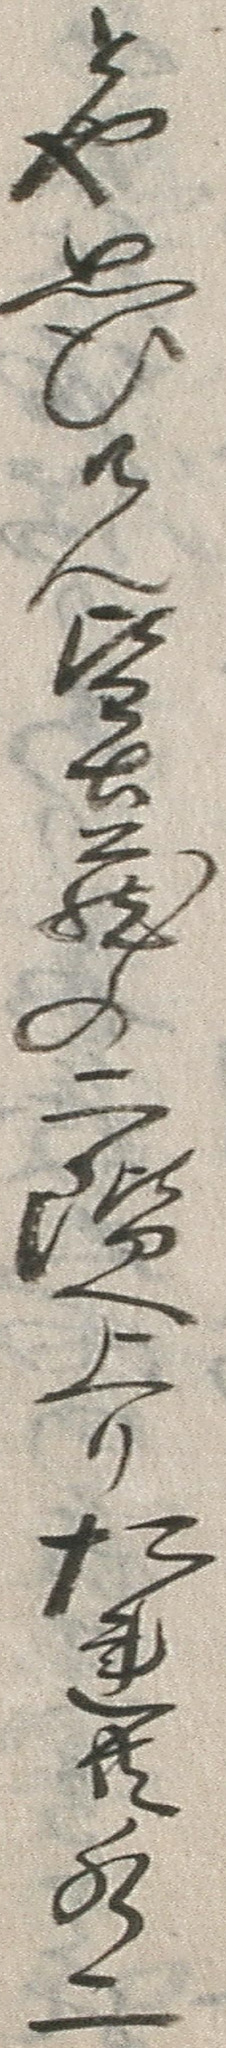とや思ひけん皆土蔵の二階へ上りたれ共水二
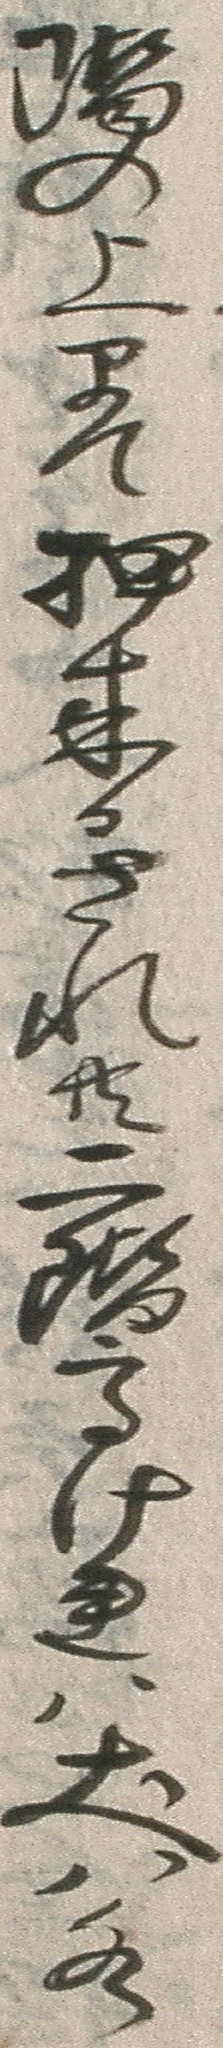階の上まて押来るされ共二階高けれは丈は水
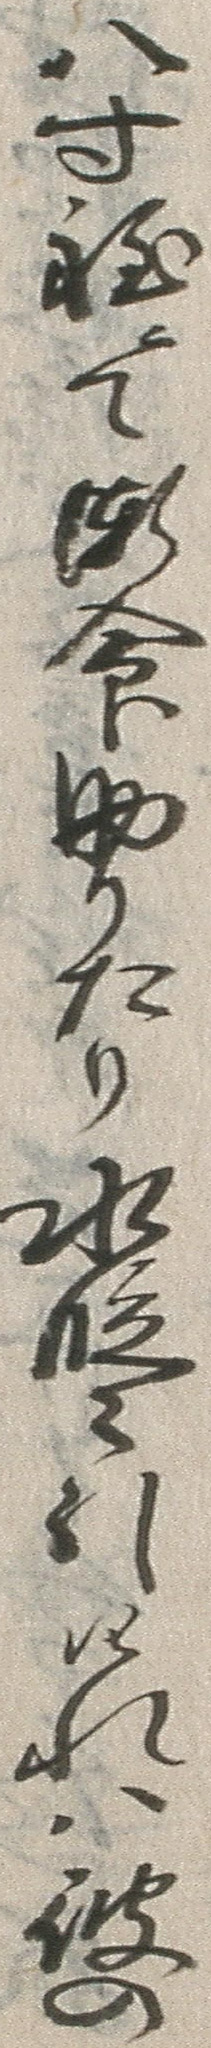八寸程にて漸命助りたり水段々引けれは彼の
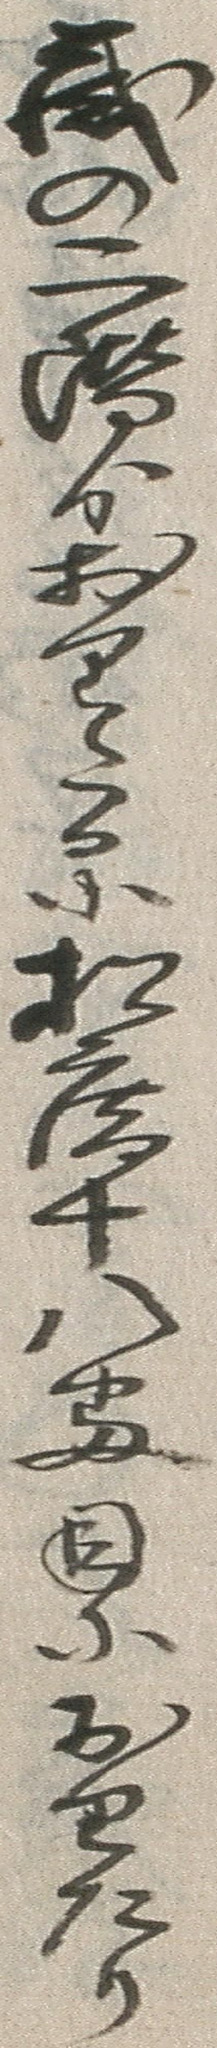蔵の二階ゟおりたるに松庵十八番目におりたり
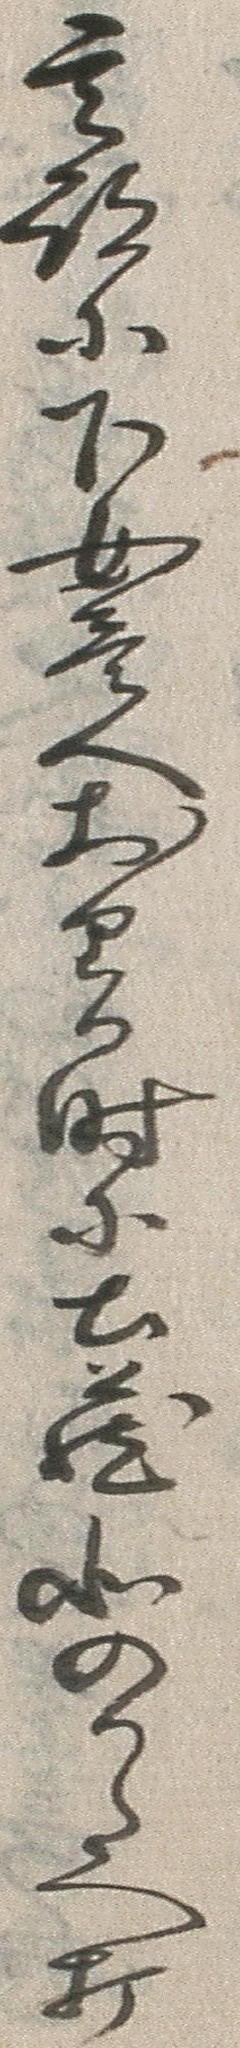其跡に下女壱人おりる時に土蔵北のかたへ打
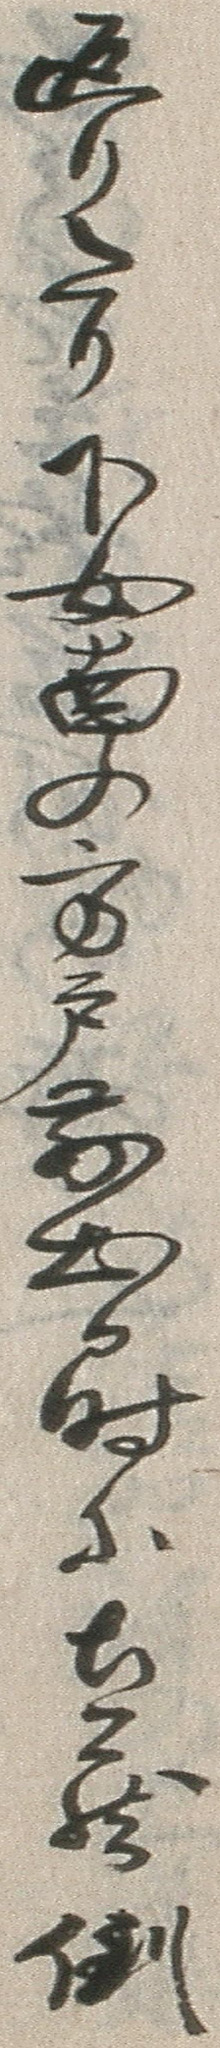返りたり下女南の方戸前出る時に土蔵倒
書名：享保十三年江戸洪水記
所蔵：東京大学地震研究所図書室 Earthquake Research Institute Library, The University of Tokyo, JAPAN
